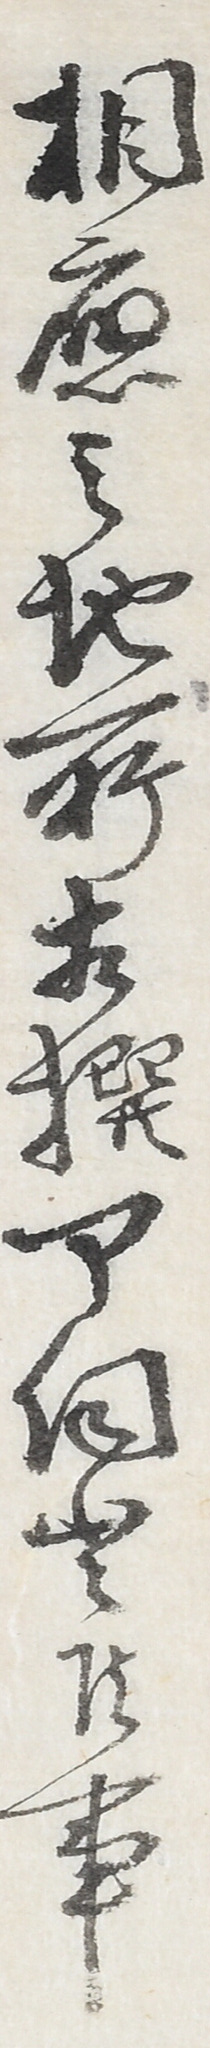相応之地所相撰可伺出候事
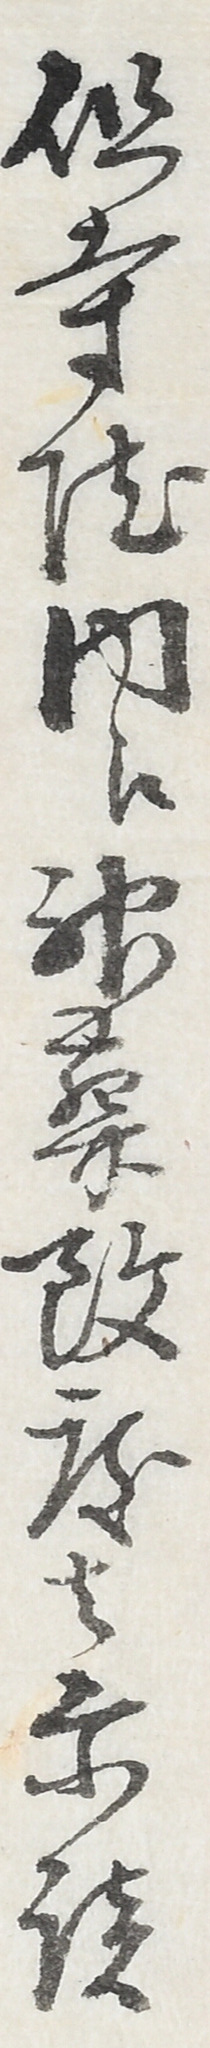但寺院内え神葬改度は示談
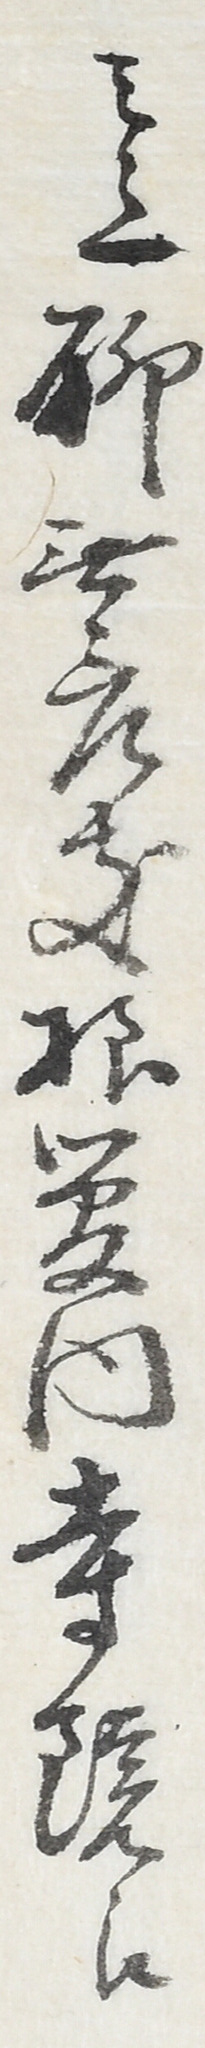之上聊無差支様管内寺院え
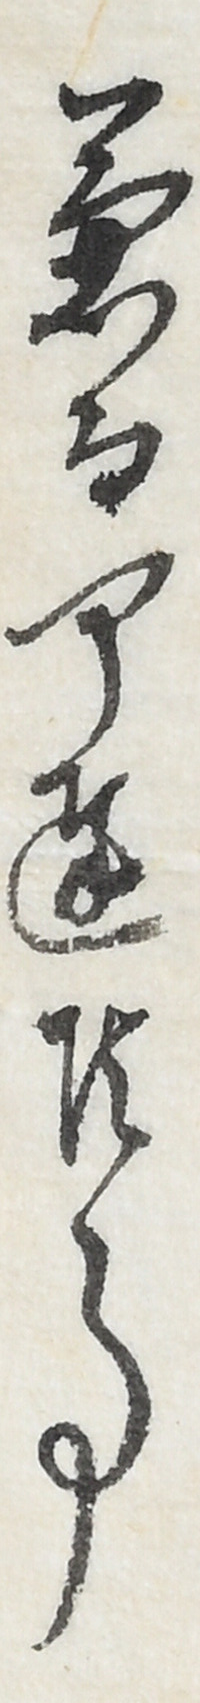兼而可達候事

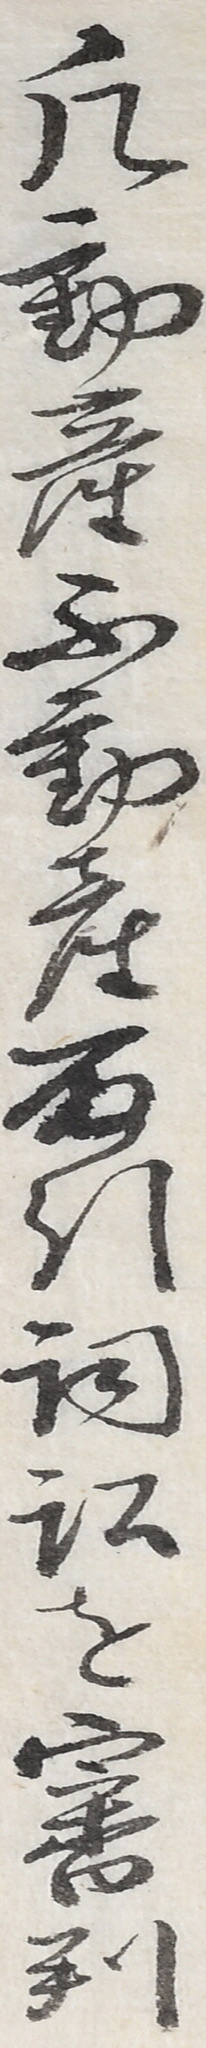凡動産不動産取引詞訟を審判
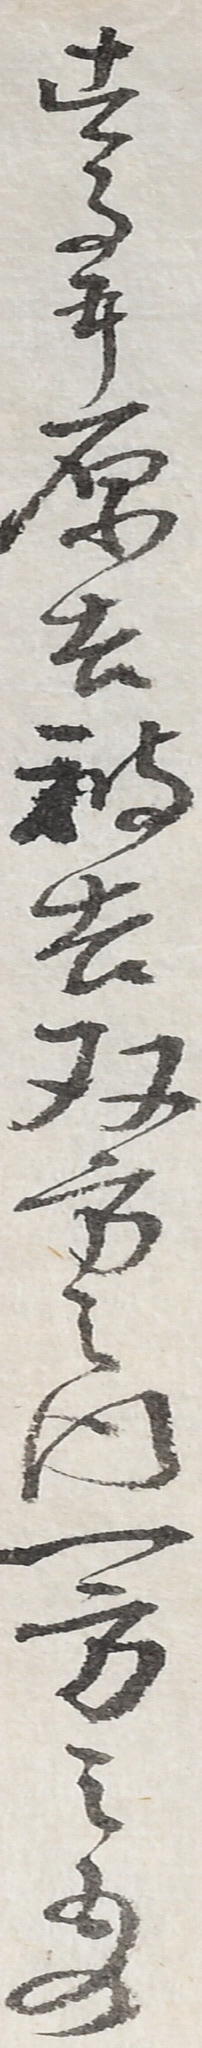するに原告被告双方之内一方之もの
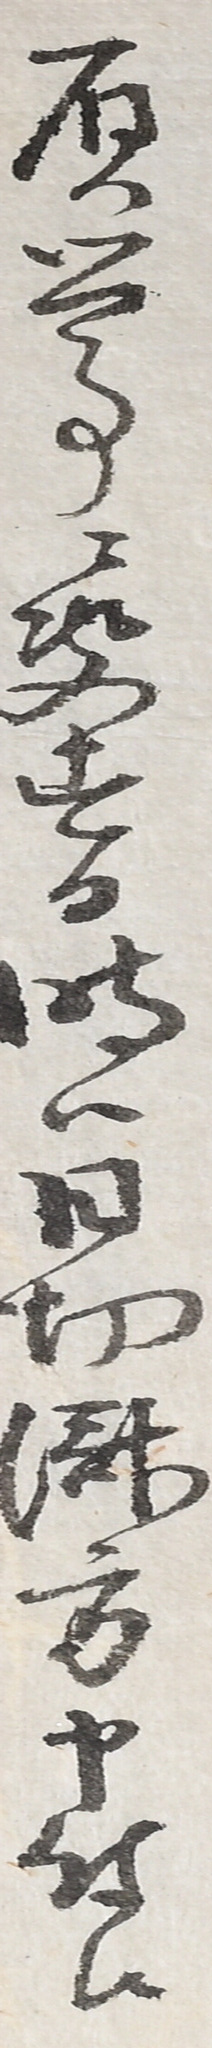屓公事ニ決する時ハ日切済方申付候
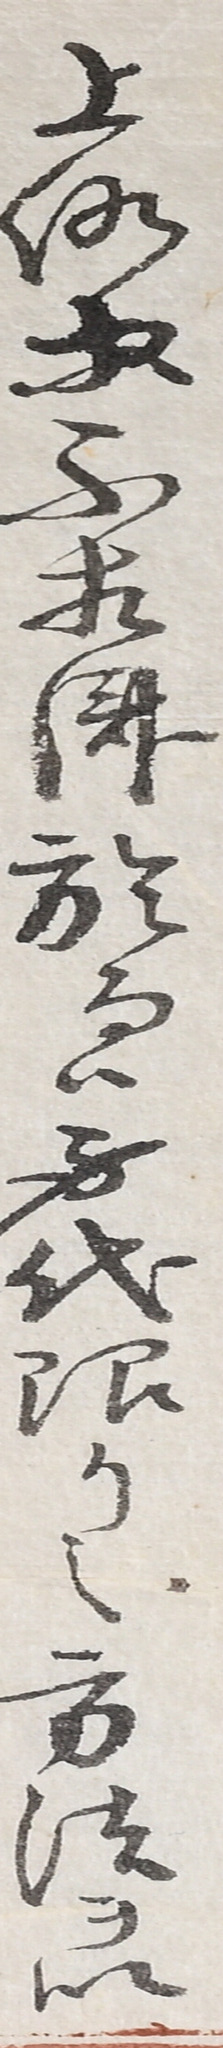上仇等不相済於而ハ身代限り之方法ヲ以
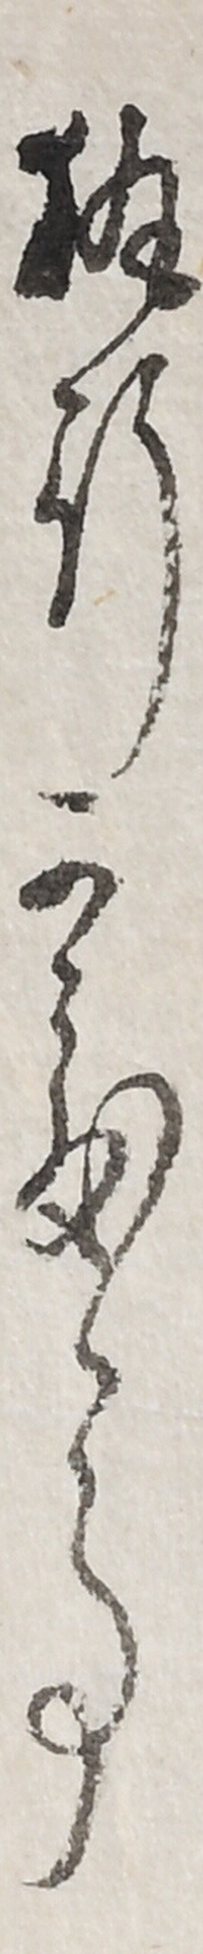執行可致候事
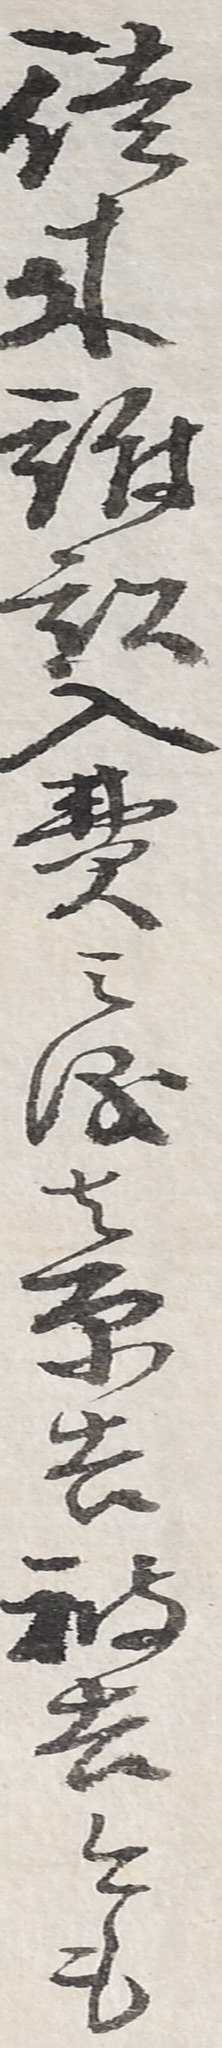徒来訴訟入費之儀は原告被告とも
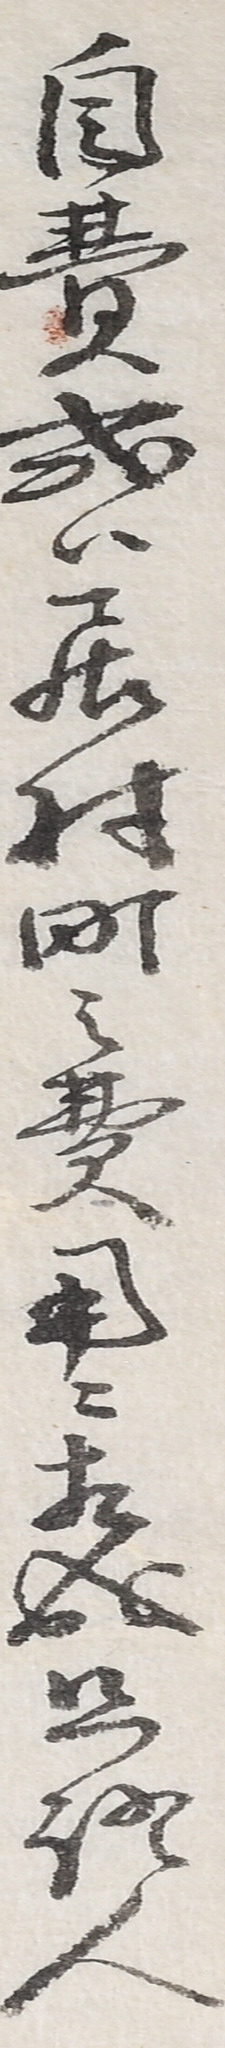自費或ハ居村町之費用ニ相成只証人
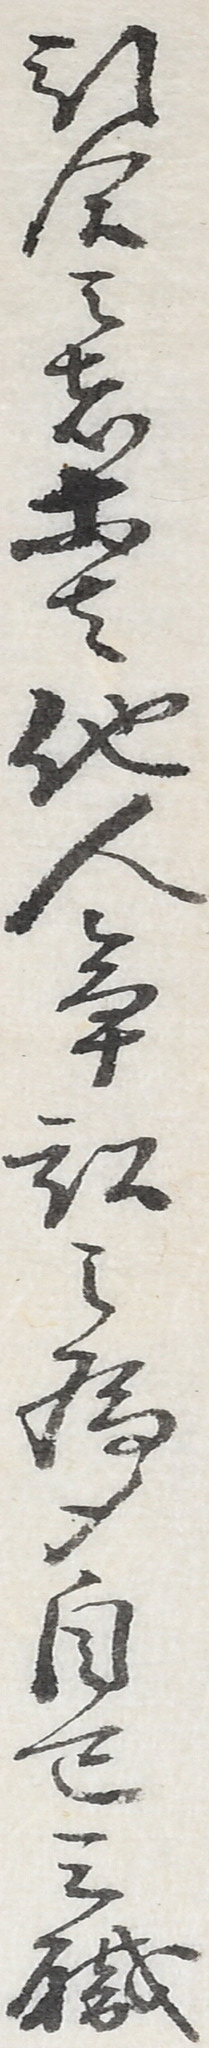引合之者等は他人争訟之為トシテ自己之職
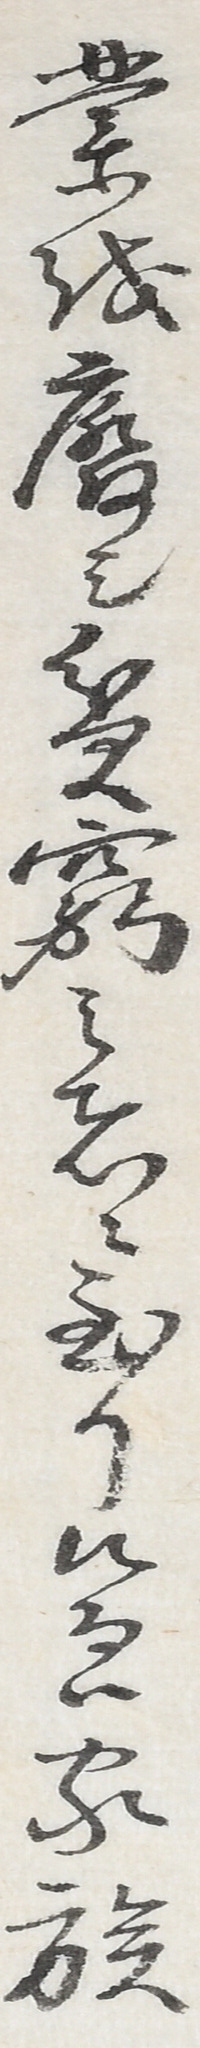業を廃シ貧窮之者ニ至り候而ハ家族
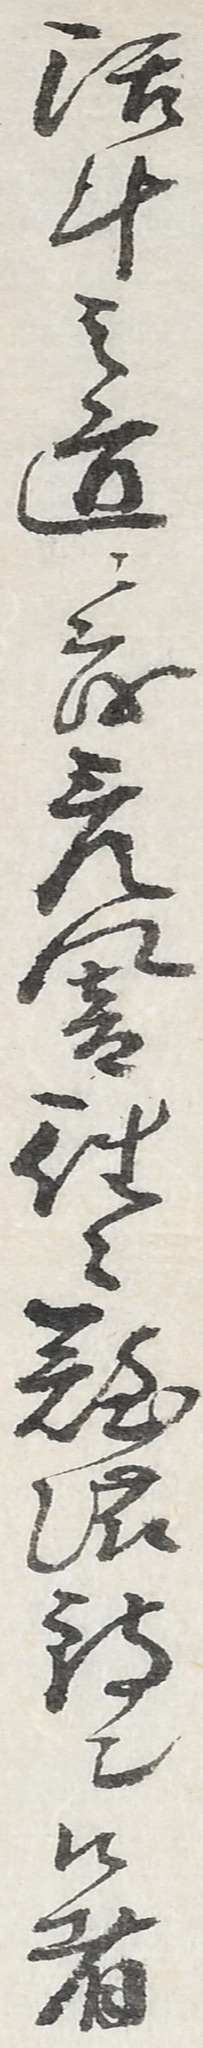活計之道ニも差響往々難渋致し候者
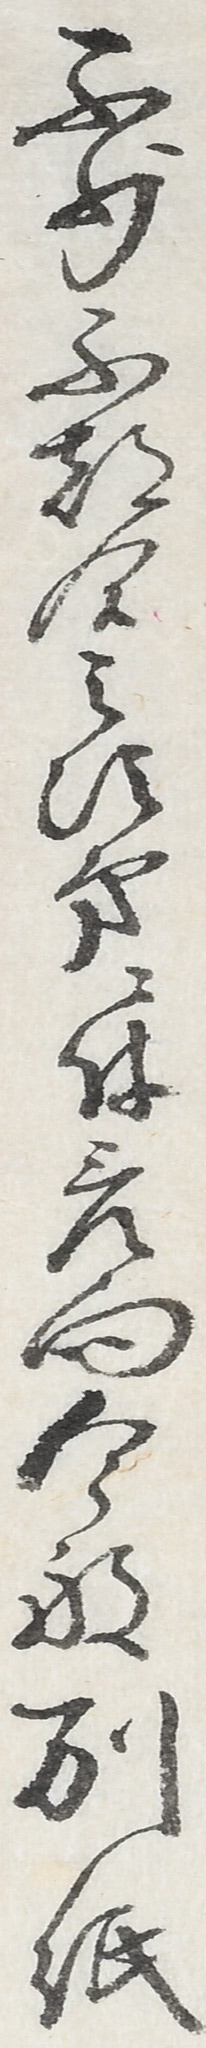不少不都合之次第ニ付差向今般別紙
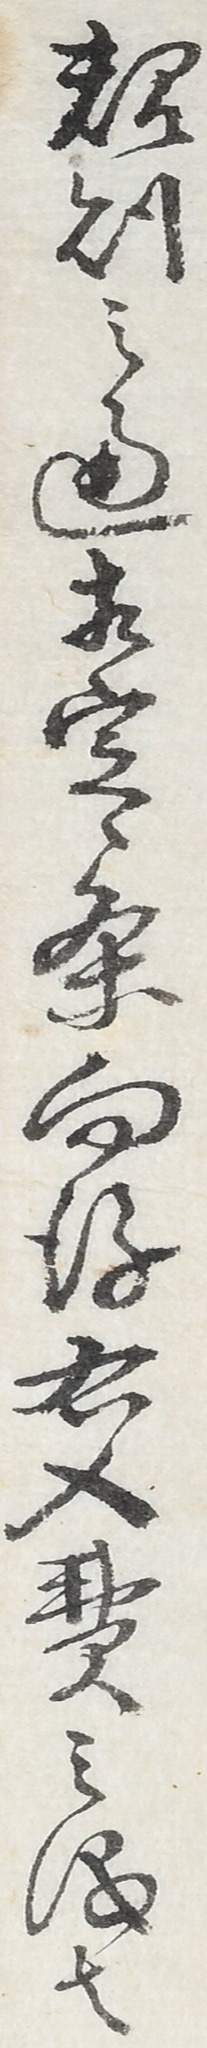規則之通相定候条向後右入費之儀は
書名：壹番・御布告一式
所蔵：伊那市立高遠町図書館・合同会社AMANE
